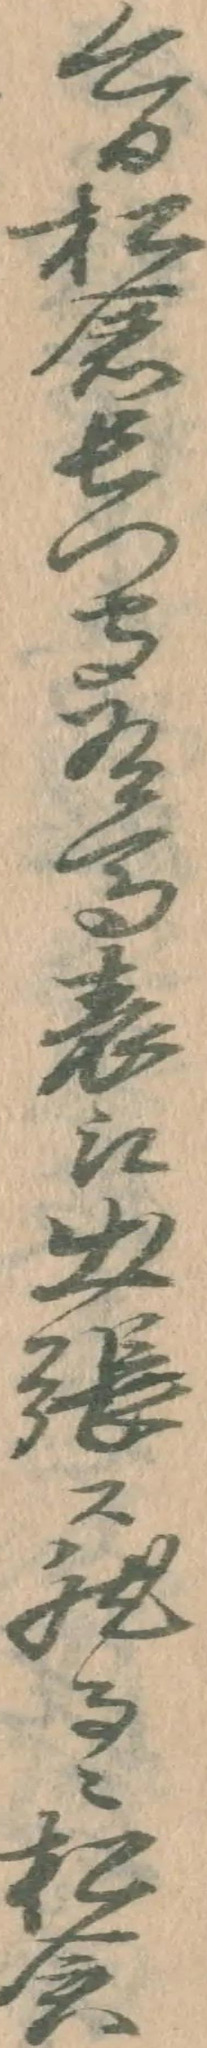今日松倉長門守有馬表江出張す然るに松倉
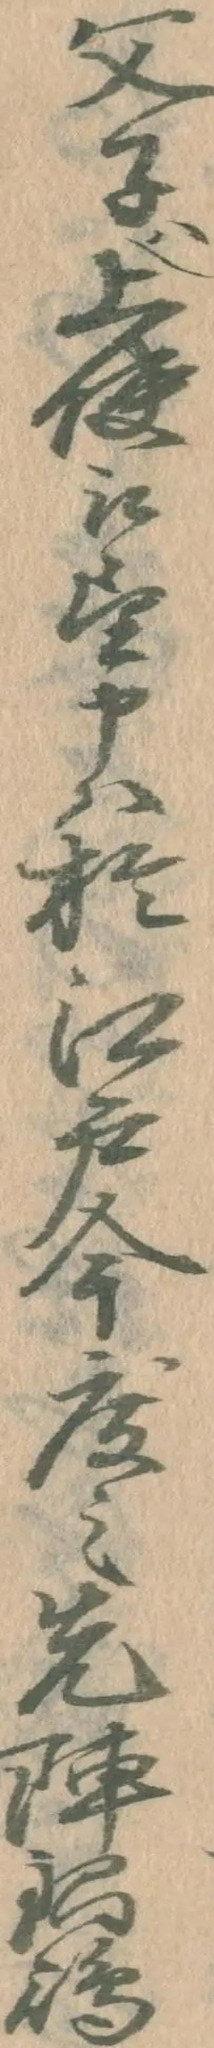父子は上使江届申は於江戸今度之先陣鍋島
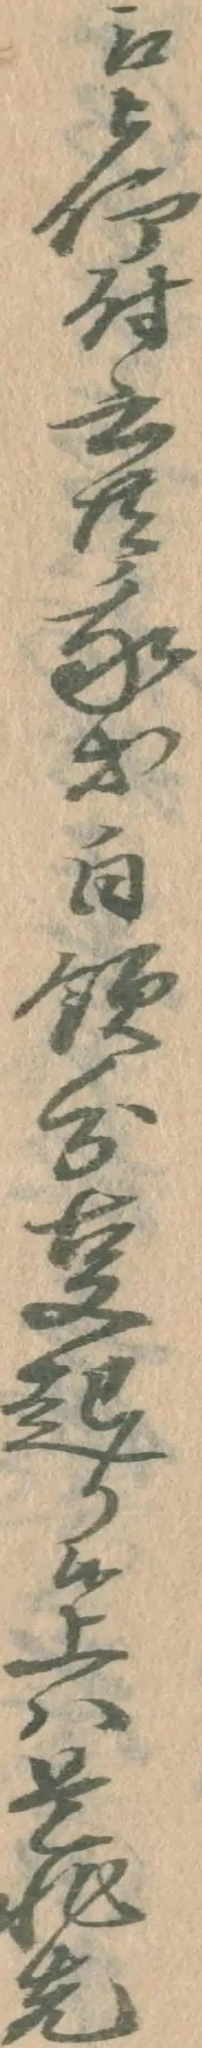江被仰付云共我等自領分事起り候上は是非先
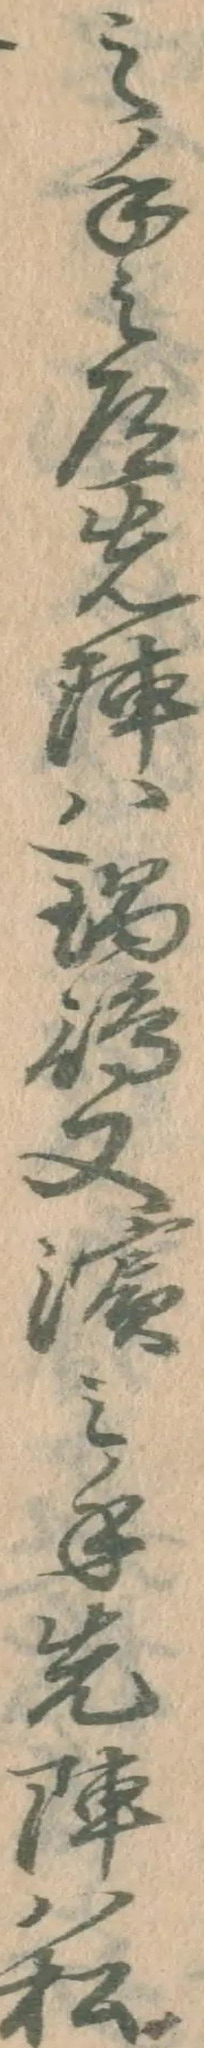之手之道先陣は鍋島又浜之手先陣は松
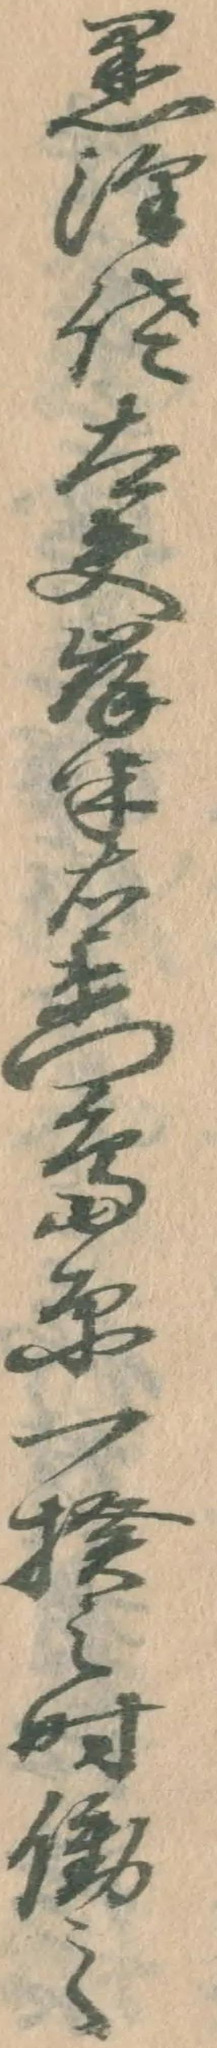黒沢佐太夫岸半右衛門島原一揆之時働之
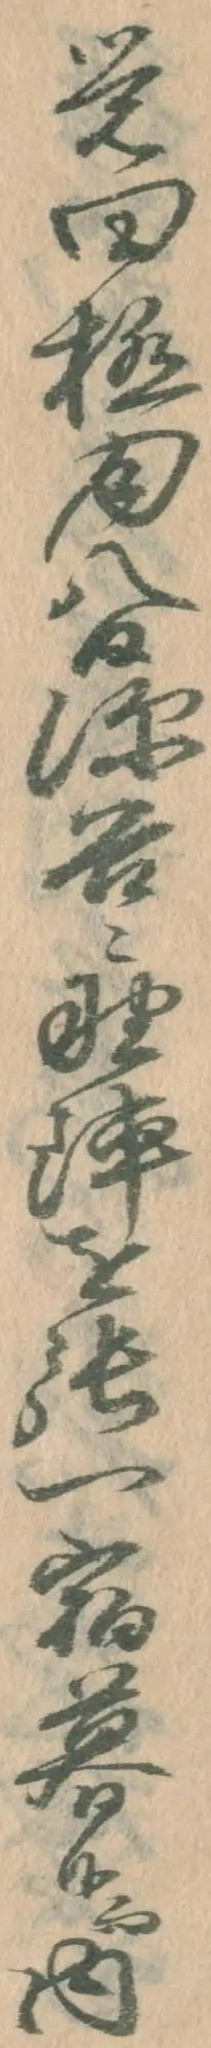覚曰極月八日深谷に野陣を張一宿暮候而内

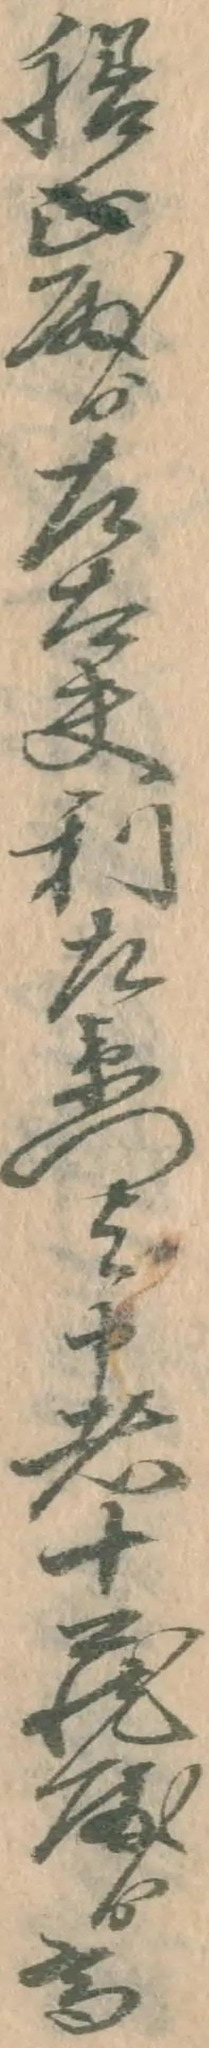膳正殿ゟ佐太夫利左衛門与申者十蔵ゟ高
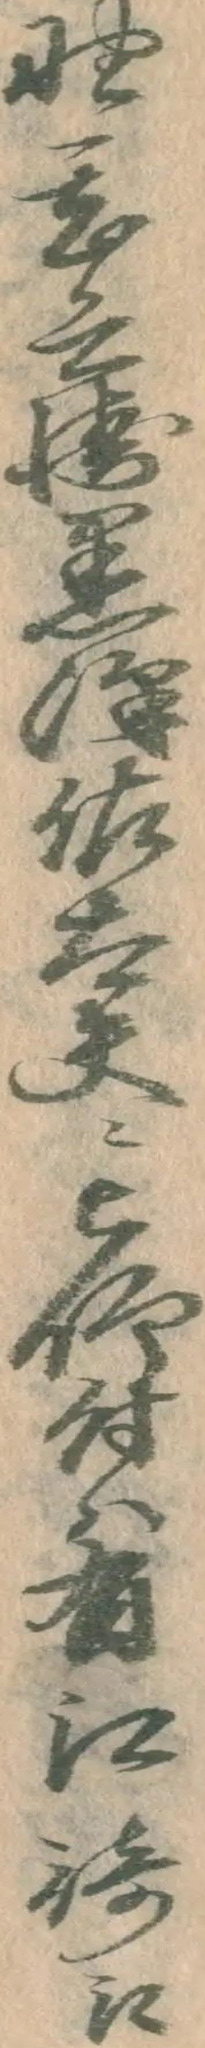野甚兵衛黒沢佐太夫に被仰付は有江崎江
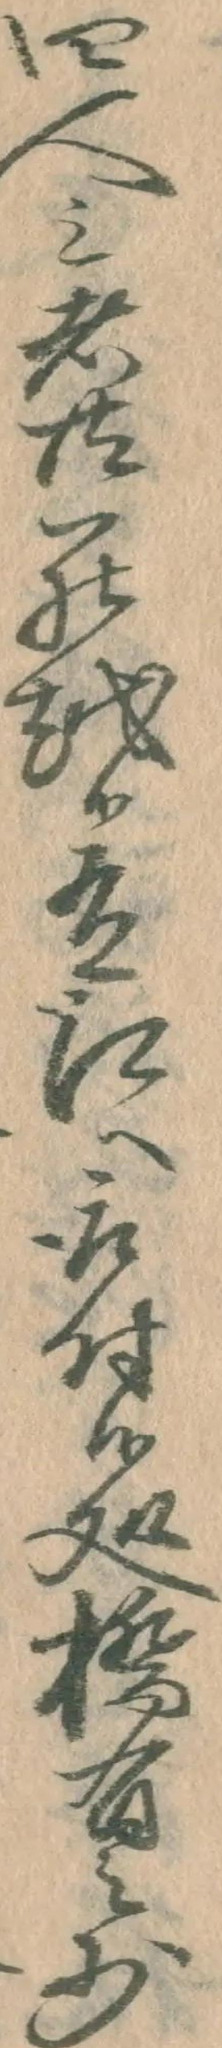四人之者共罷越候有江へ取付候処橋有之少
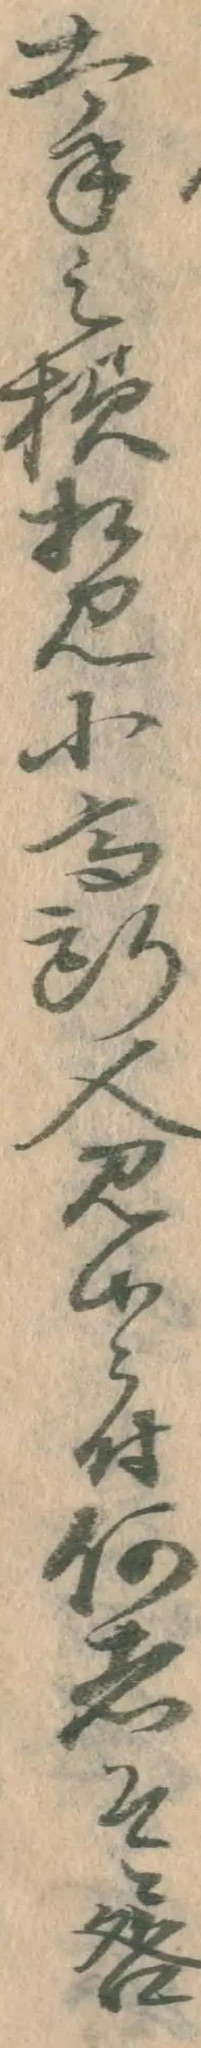土手之様相見小高所人見候に付何者そと咎
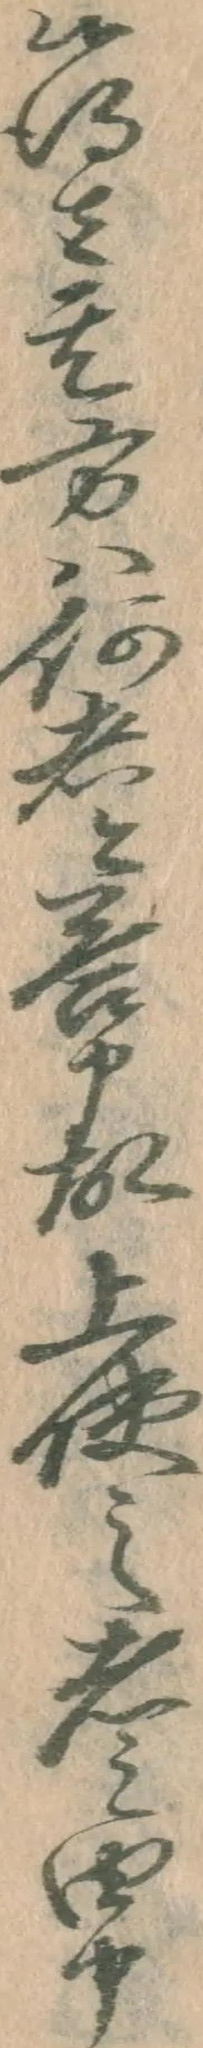候得者其方は何者と答申故上使之者之由申
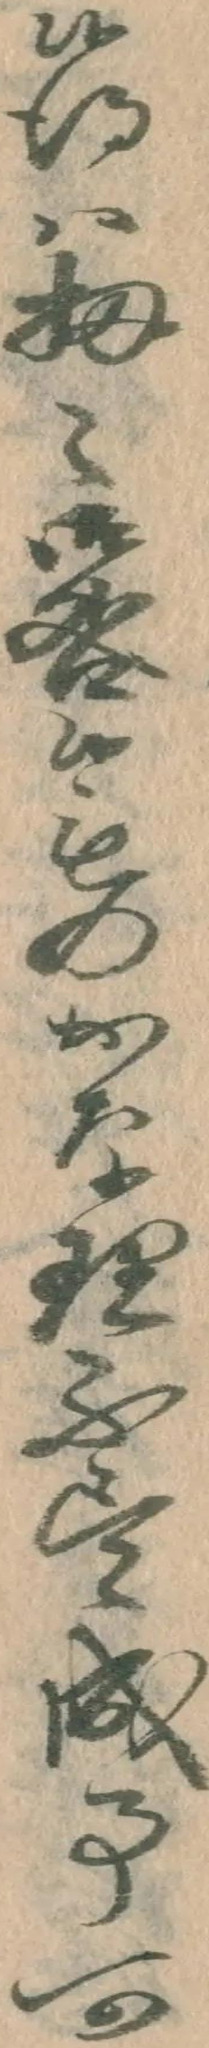候得は扨々御咎候ものかな理ふ尽成事可
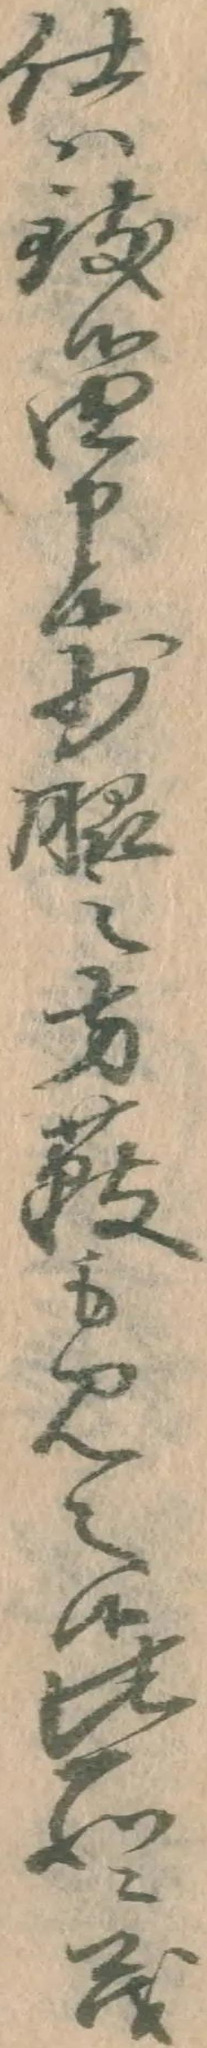仕は致候由申候少脇之方藪も見へ候此所に茂
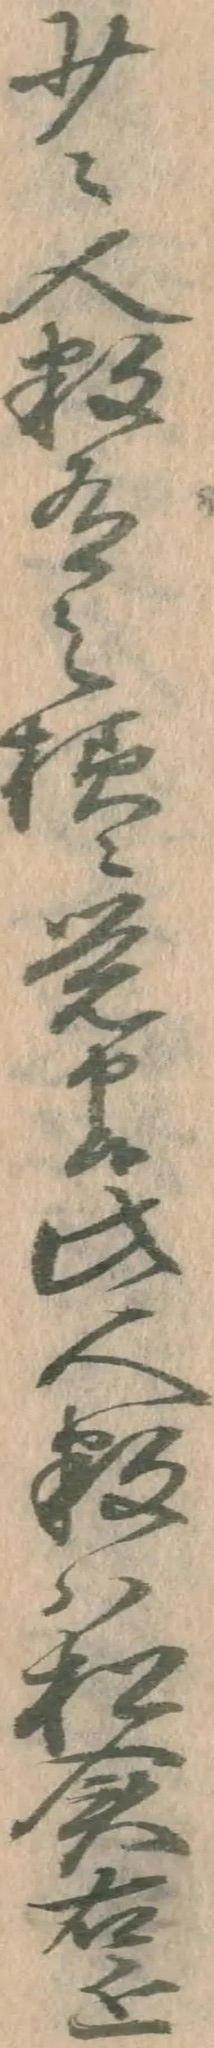少々人数有之様に覚申候此人数は松倉右近
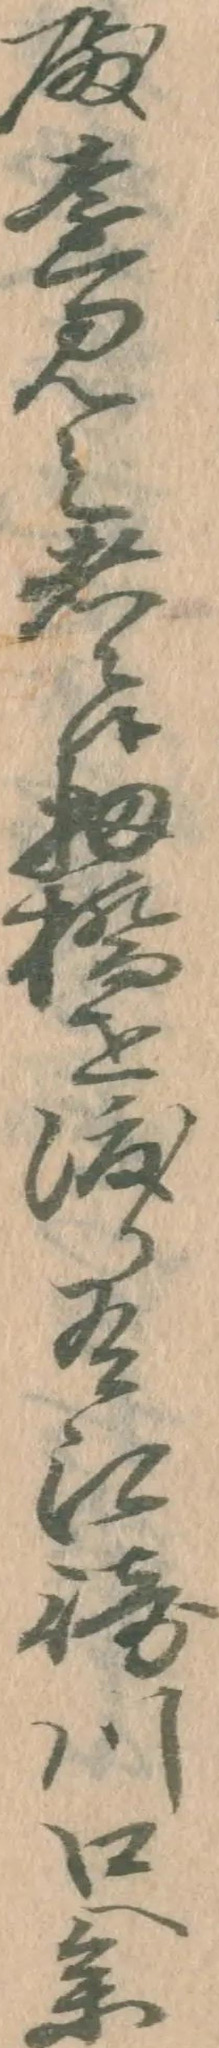殿遠見之者に候扨橋を渡り有江崎川口へ参
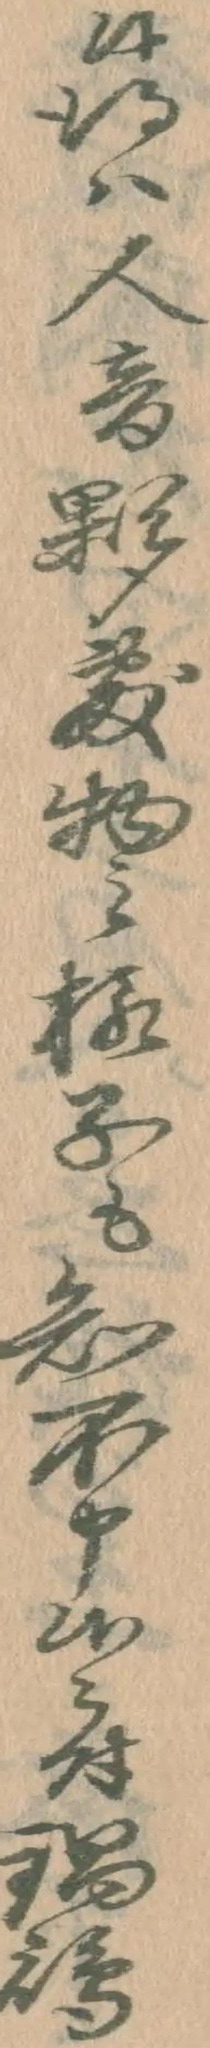候得は人音夥敷物之様子も知不申候に付鍋島
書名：切支丹御退治記 49巻. [4]
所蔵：国立国会図書館 National Diet Library, JAPAN
